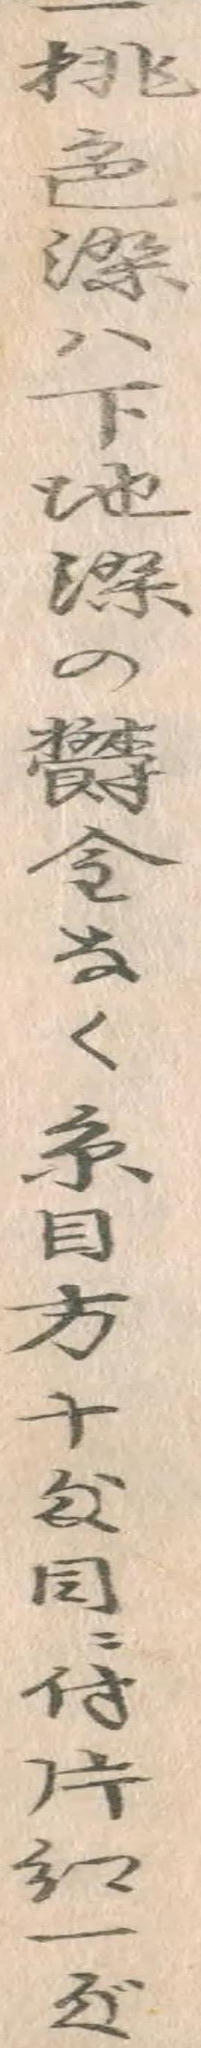一桃色染は下地染の鬱金なく糸目方十匁目に付片紅一匁
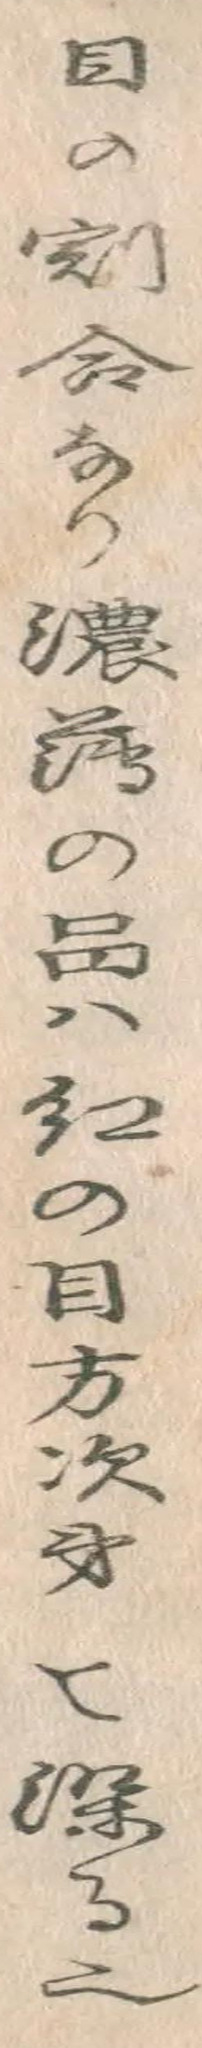目の割合なり濃薄の品は紅の目方次第て染る也
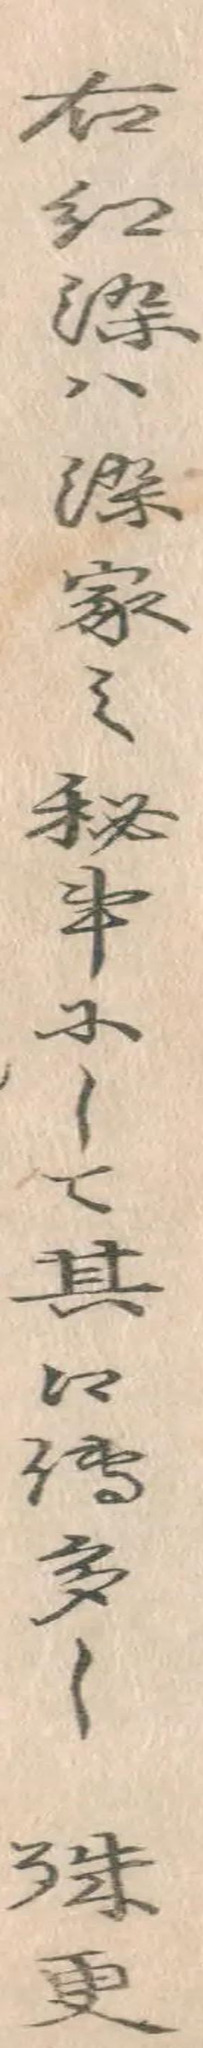右紅染は染家之秘事にして其口伝多し殊更
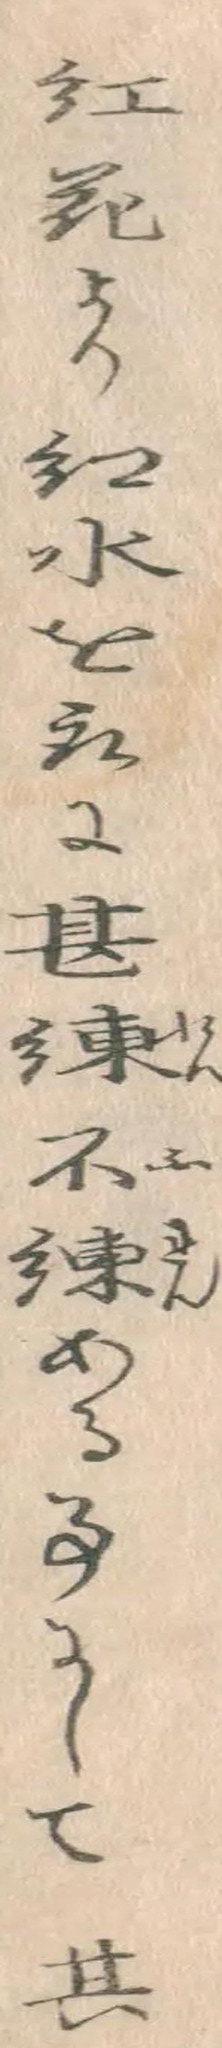紅花より紅水を取に甚練不練ある事にして其

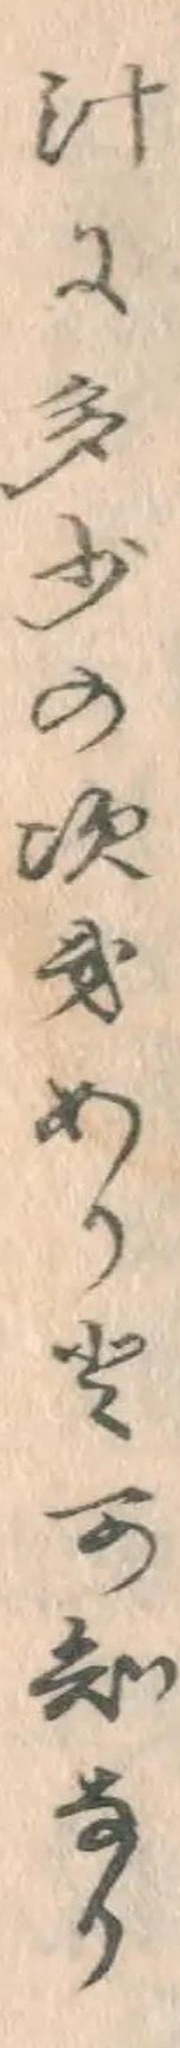汁に多少の次第ありと可知なり
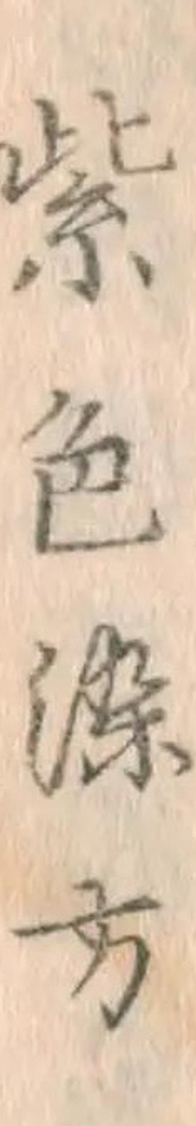紫色染方
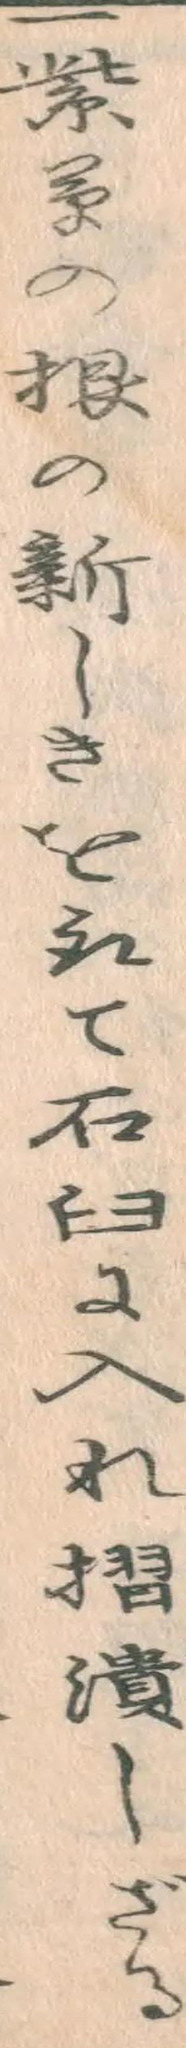一紫草の根の新しきを取て石臼に入れ摺潰しざる
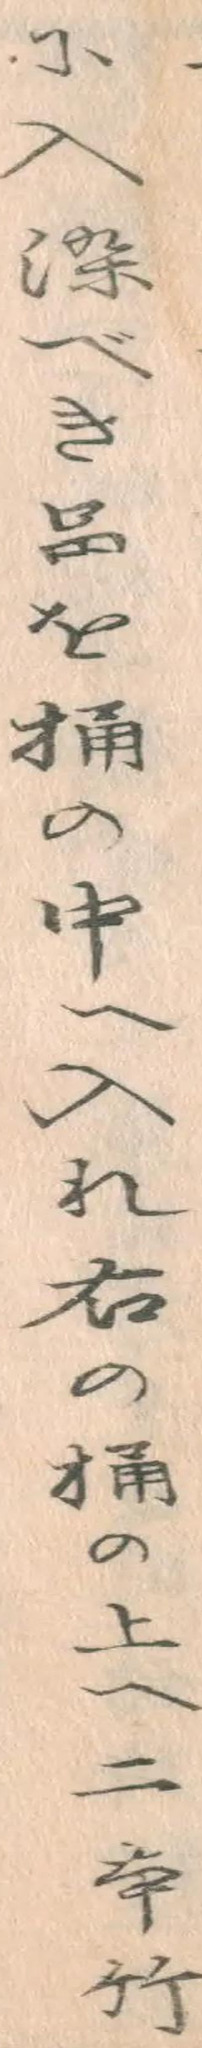に入染べき品を桶の中へ入れ右の桶の上へ二本竹
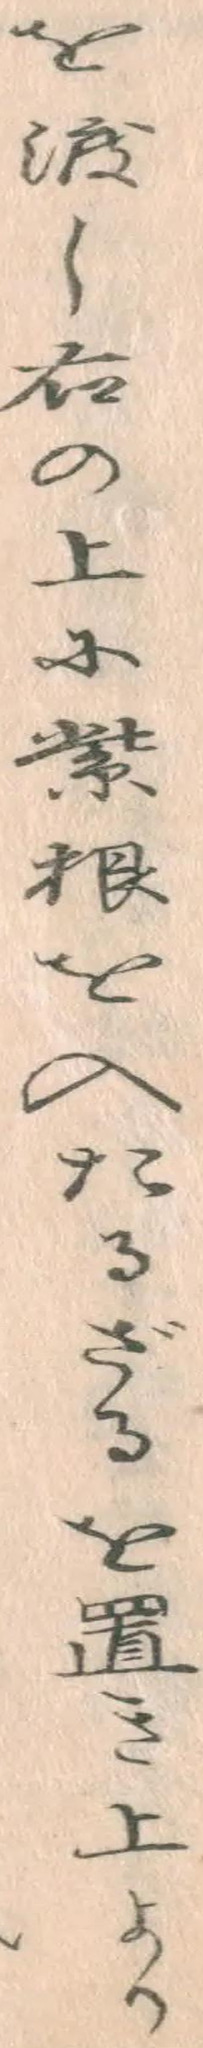を渡し右の上に紫根を入たるざるを置き上より
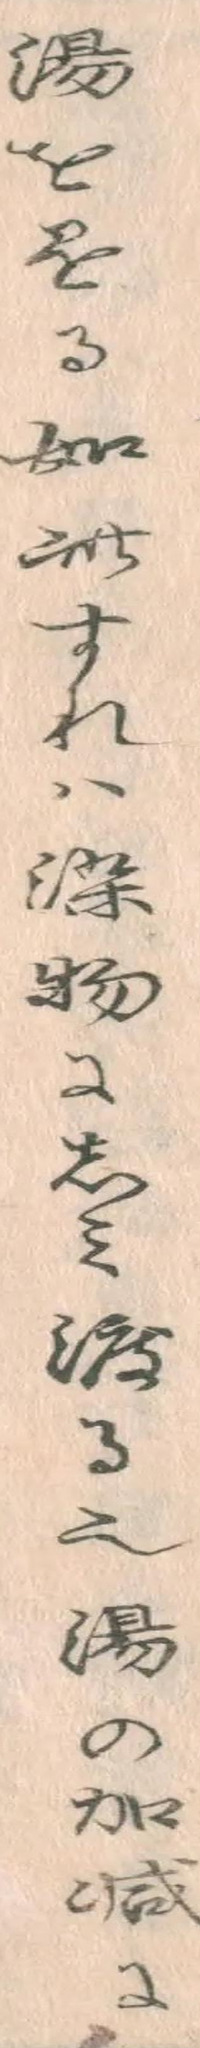湯を懸る如此すれは染物にしみ渡る也湯の加減に
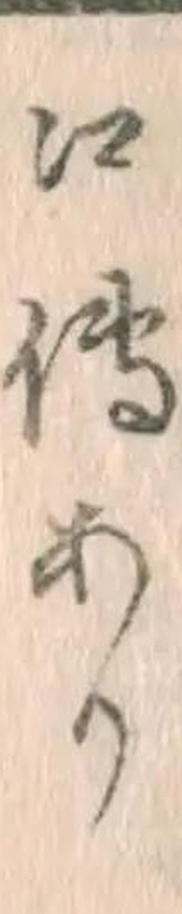口伝あり
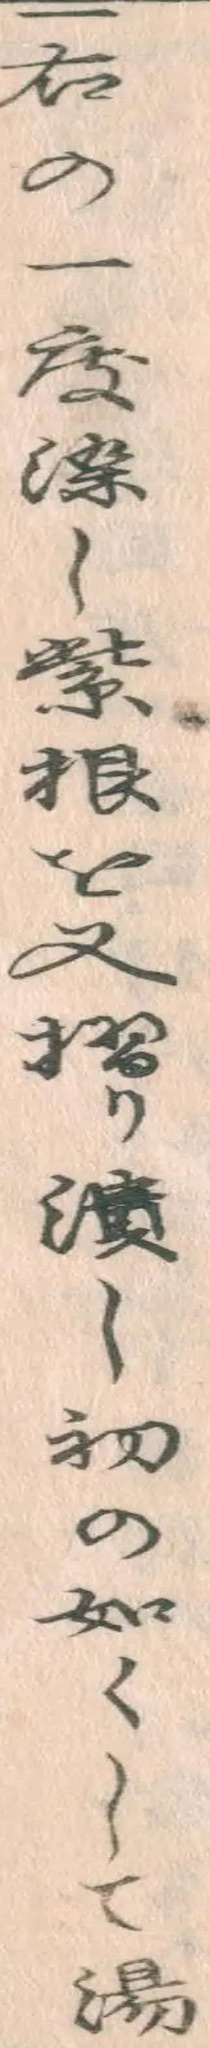一右の一度染し紫根を又摺り潰し初の如くして湯
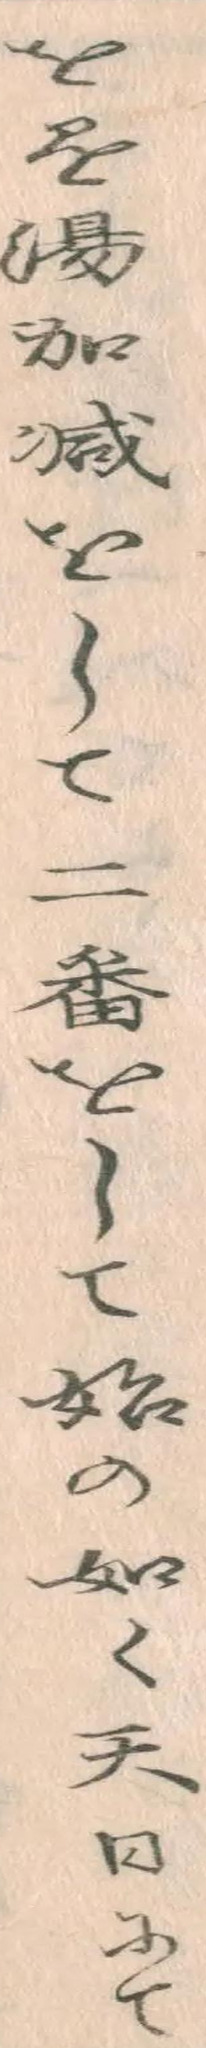を懸湯加減をして二番をして始の如く天日にて
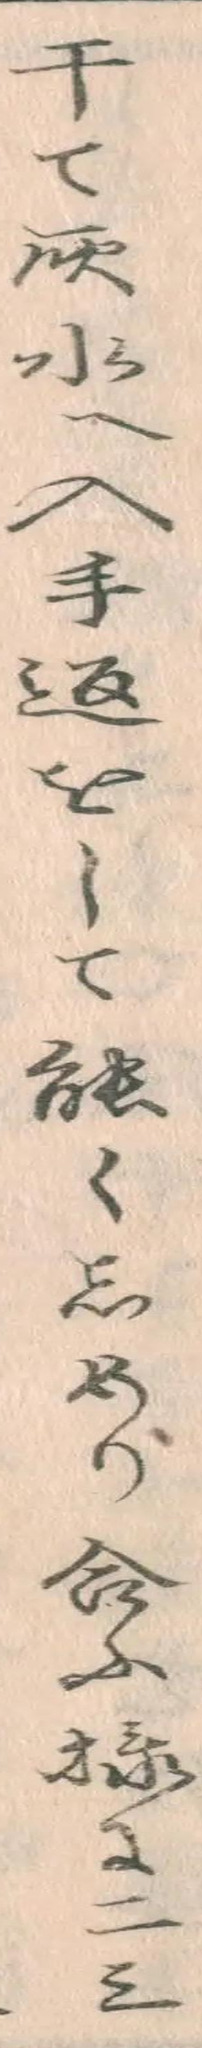干て灰水へ入手返をして能くしめり合ふ様に二三
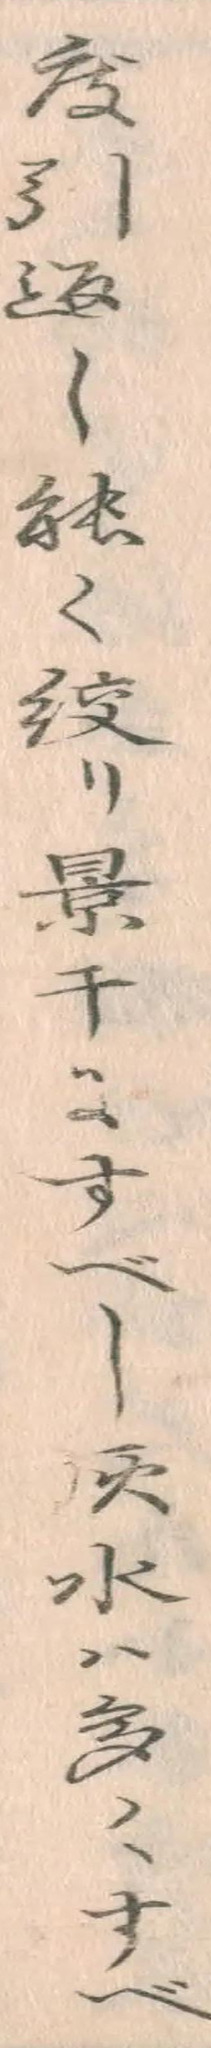度引返し能く絞り景干にすべし灰水は多くすべ
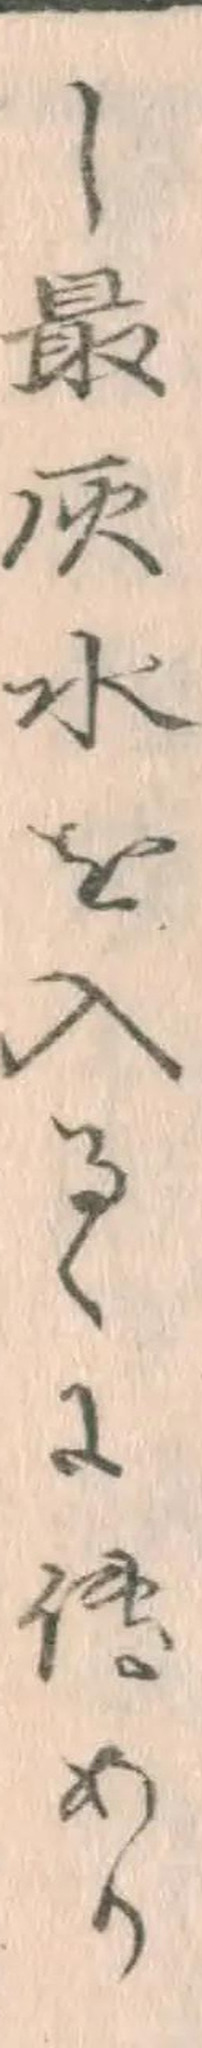し最灰水を入るゝに伝あり
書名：機織彙編 5巻. [1]
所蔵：国立国会図書館 National Diet Library, JAPAN
